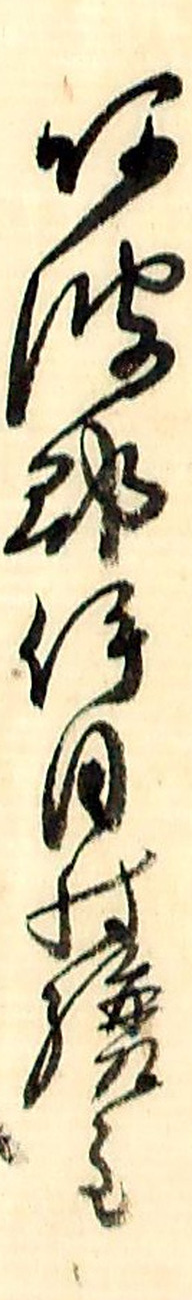阿波郡伊月村譲主
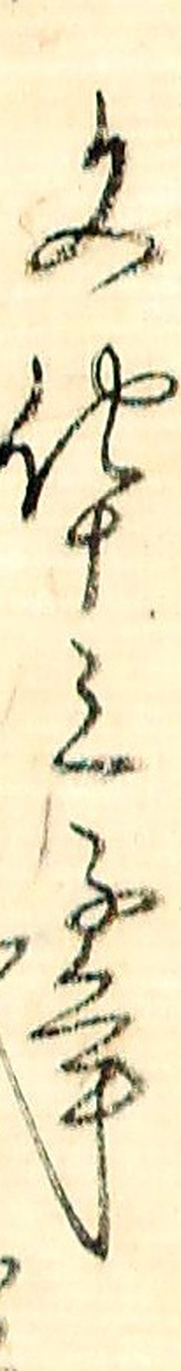文化十三子年
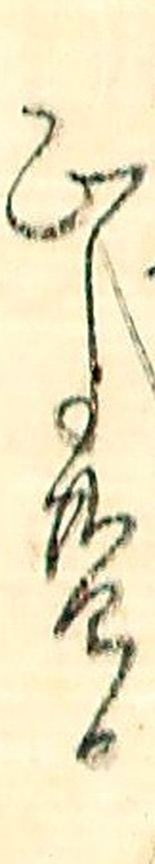正月廿四日
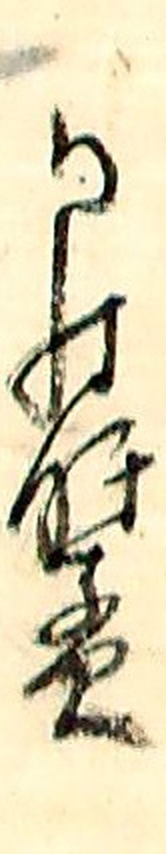同村肝煎
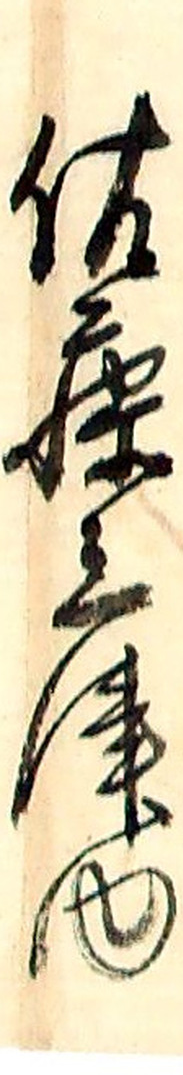佐藤三津内
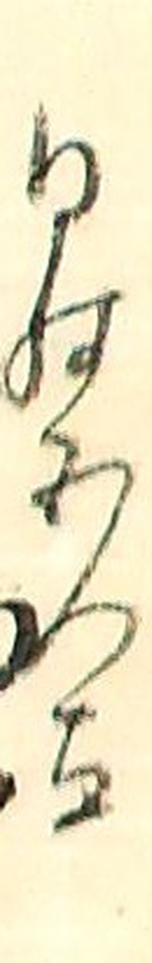同村五人与
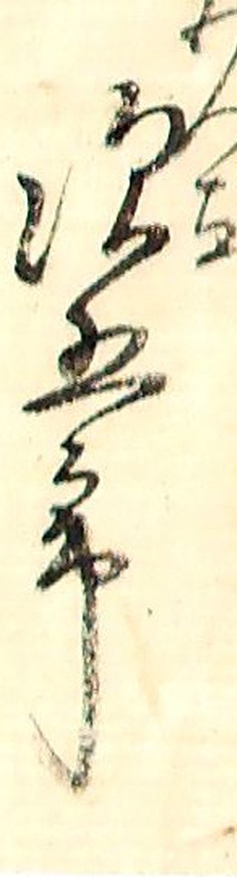次五郎

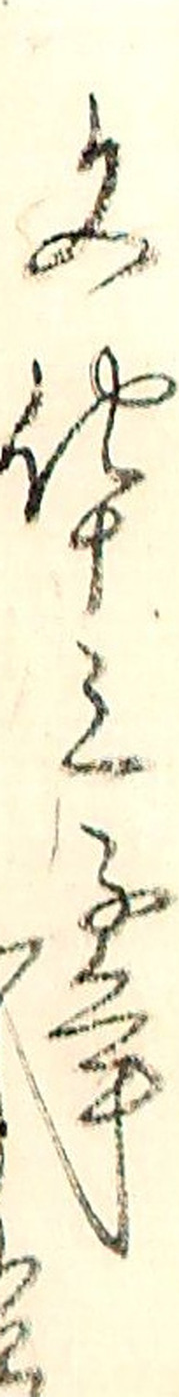文化十三子年
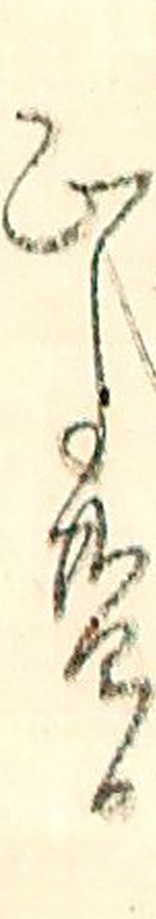正月廿四日
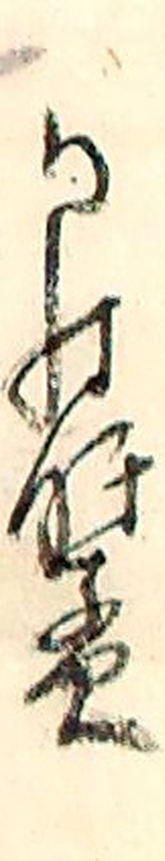同村肝煎
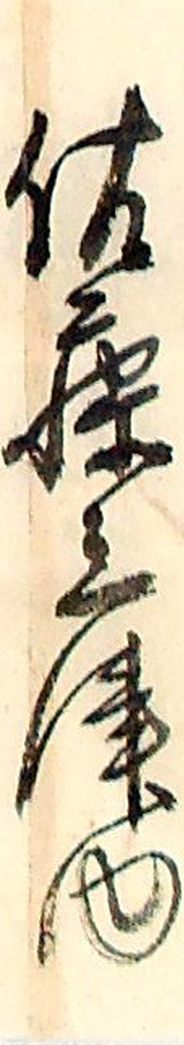佐藤三津内
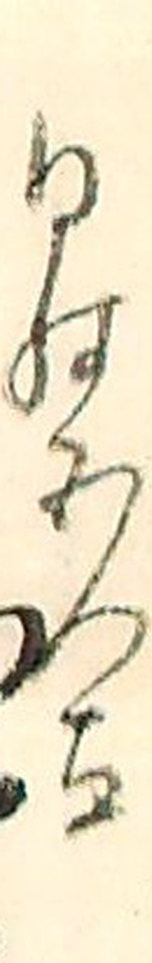同村五人与
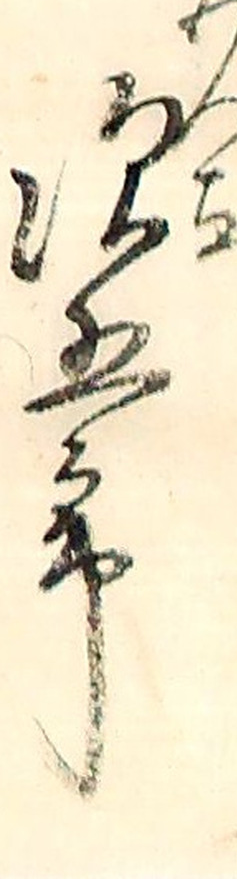次五郎
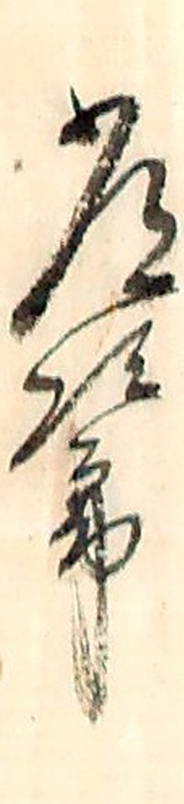常次郎
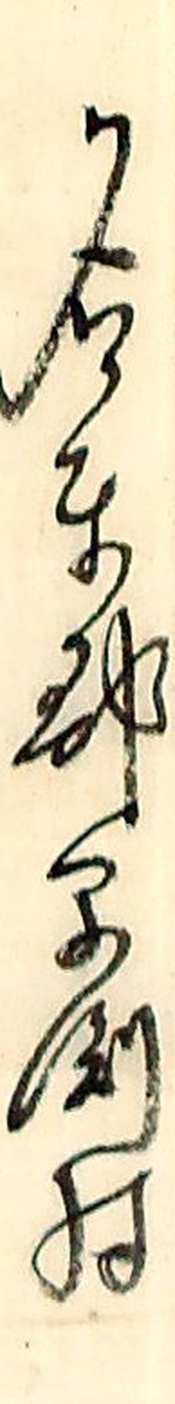名東郡早淵村
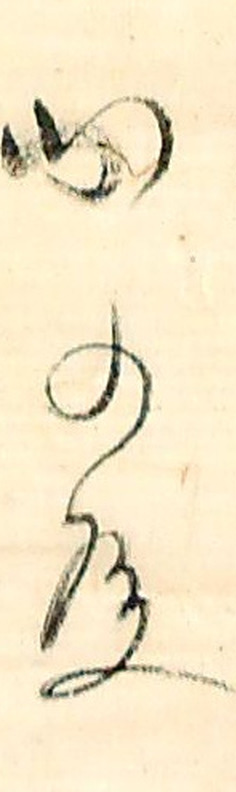かの殿
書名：諸御願書控(後藤氏壱番）
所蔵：鳴門教育大学 Naruto University of Education
